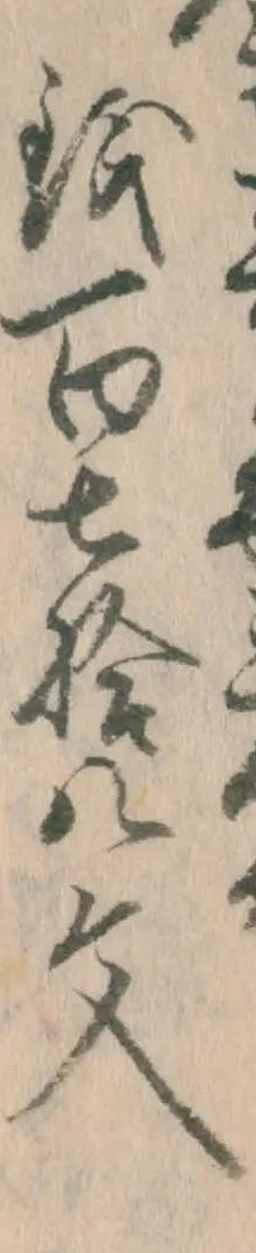銭百七拾八文
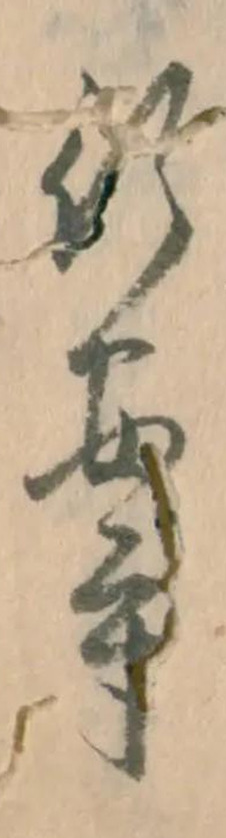行安寺

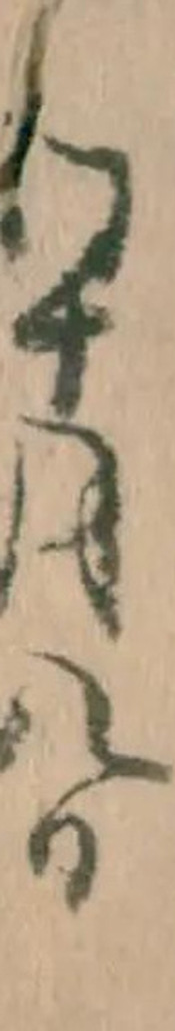同十月八日
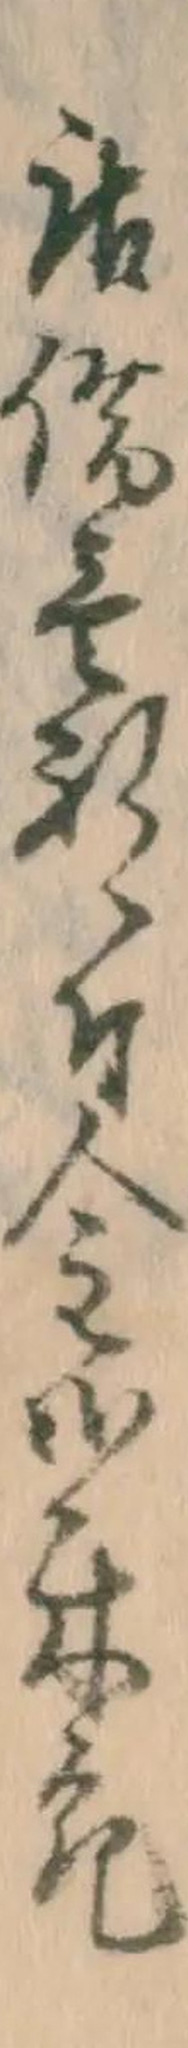店借壱軒ニ付金弐朱宛
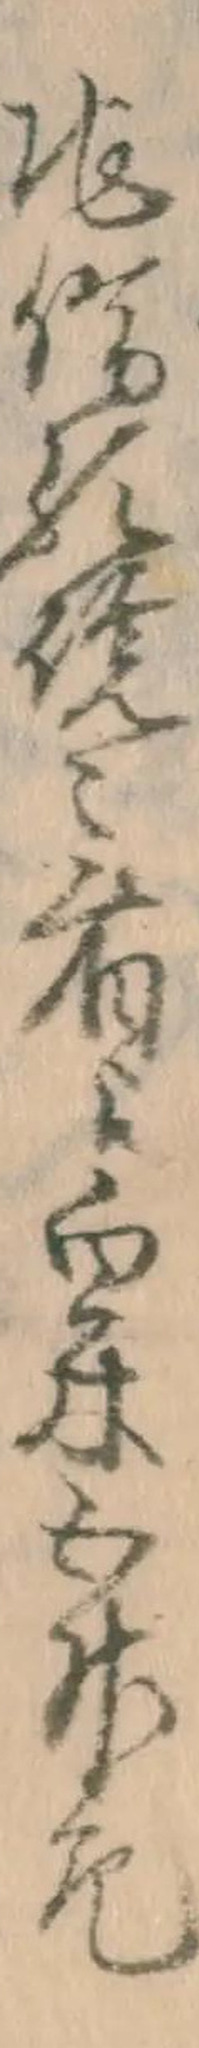地借類焼之者え白米五升宛
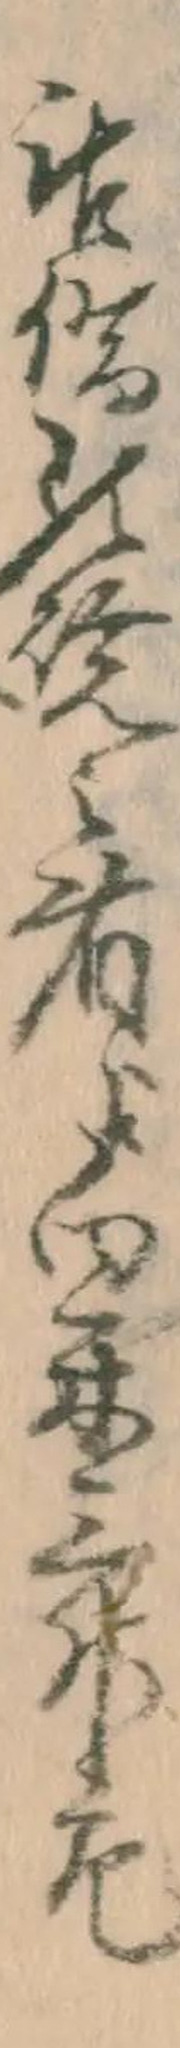店借類焼之者え白米三升宛
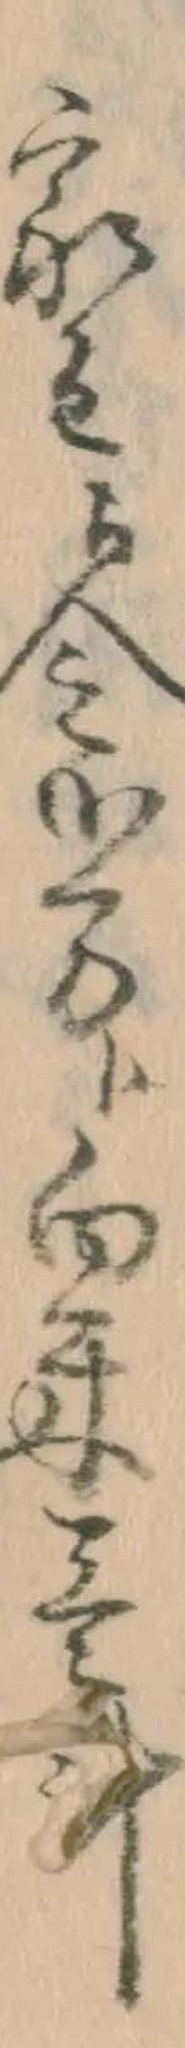家主え金弐分ト白米壱斗
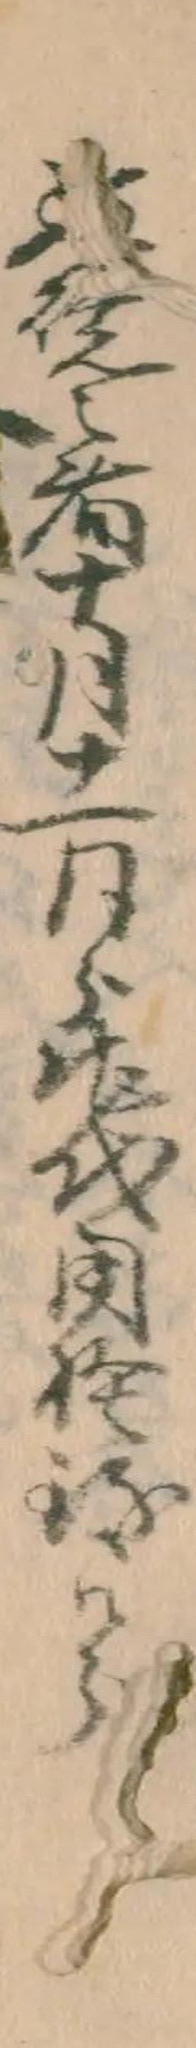類焼之者十月十一月分地代用捨致候分
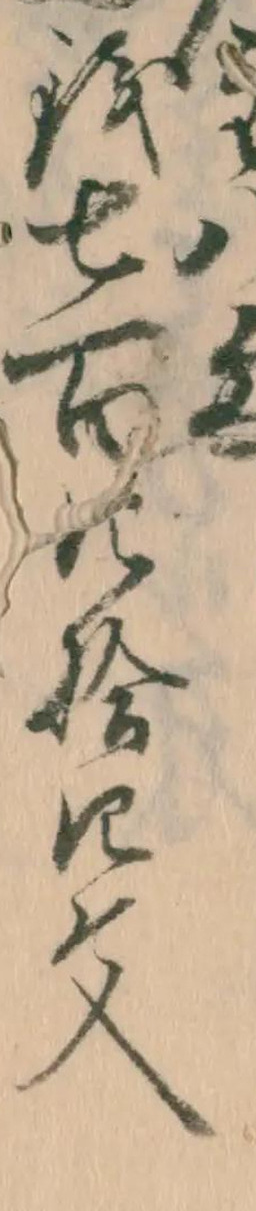銭七百四拾四文
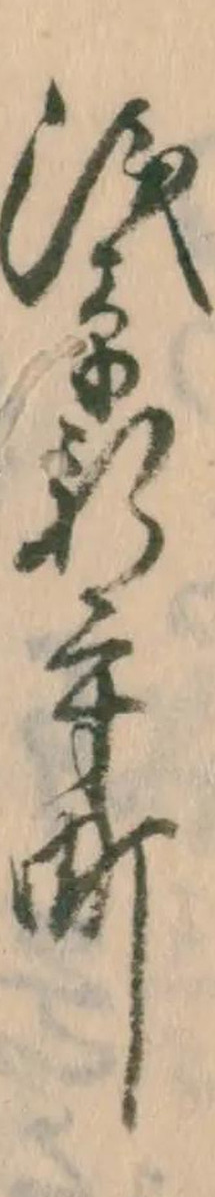浅草新寺町
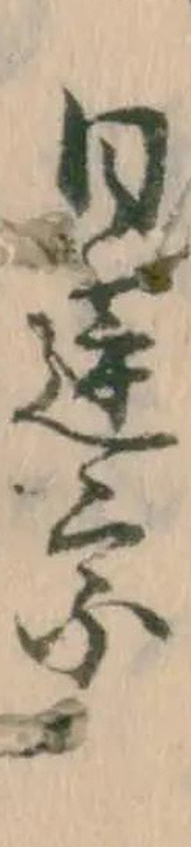日蓮宗
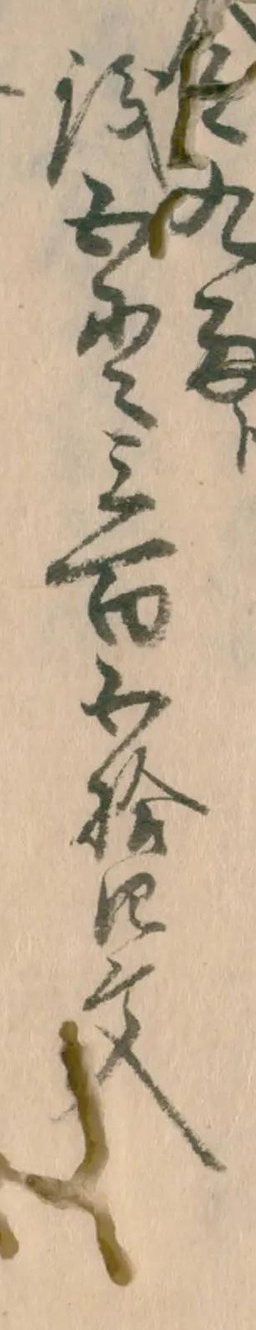銭五貫三百五拾四文
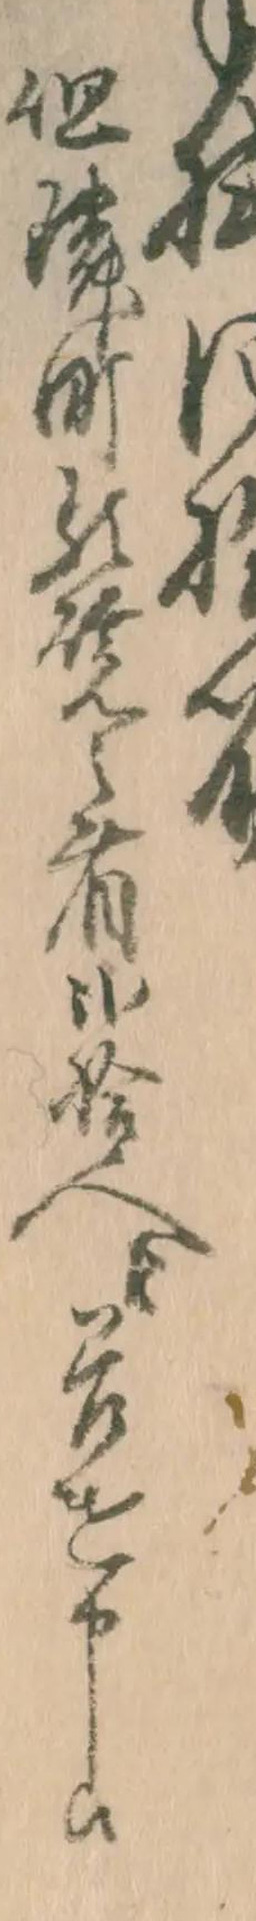但隣町類焼之者弐拾人え差遣申候
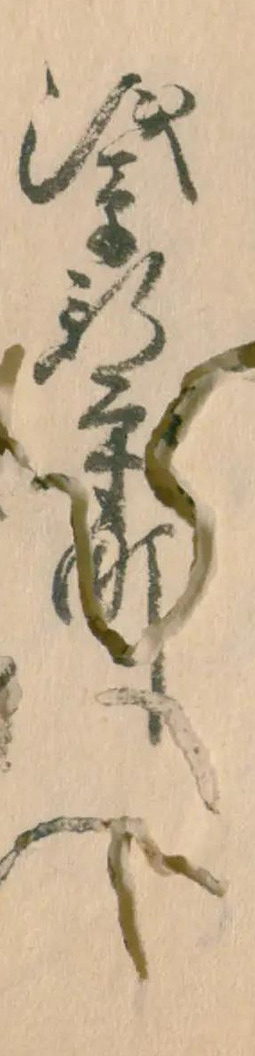浅草新寺町
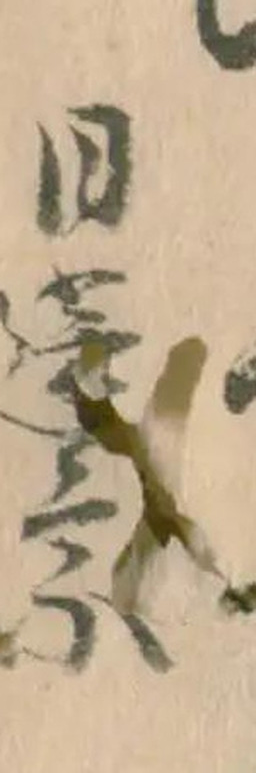日蓮宗

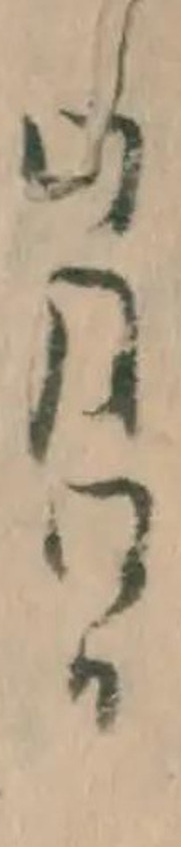同月同日
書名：武家方并寺院等ニテ施差出候一件
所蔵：国立国会図書館 National Diet Library, JAPAN
